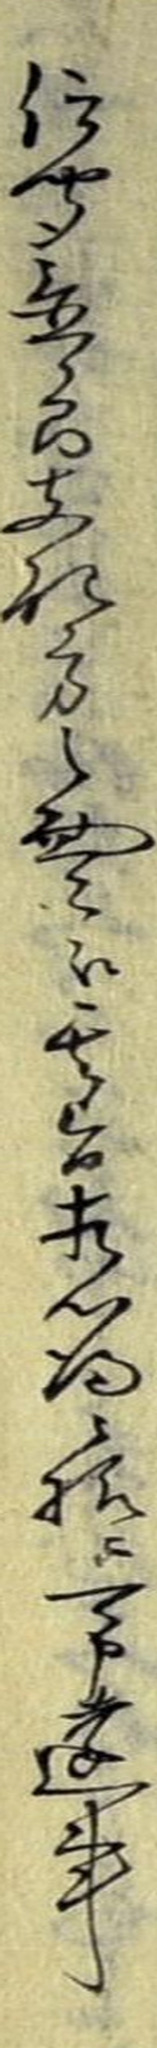仰聞置候間支配方之面々江其旨相心得候様ニ可申達事

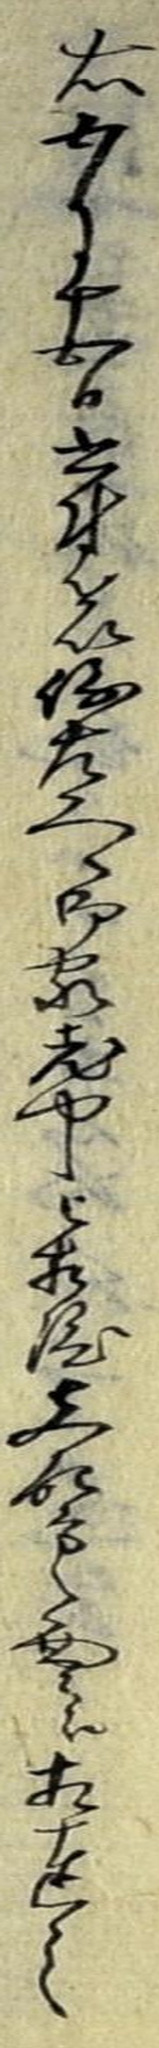右五月十五日書付を以儀左衛門へ御家老中被相渡支配方之面々江相達之
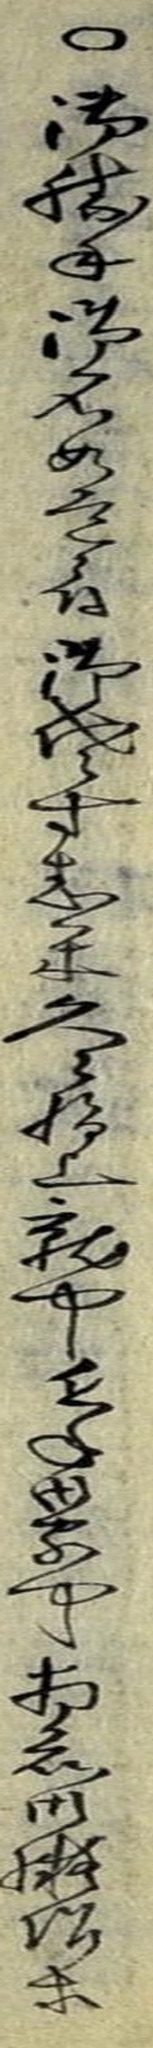〇御勝手御不如意ニ付御代々寸志米久々指上就中近年御家中拝知御擬作等
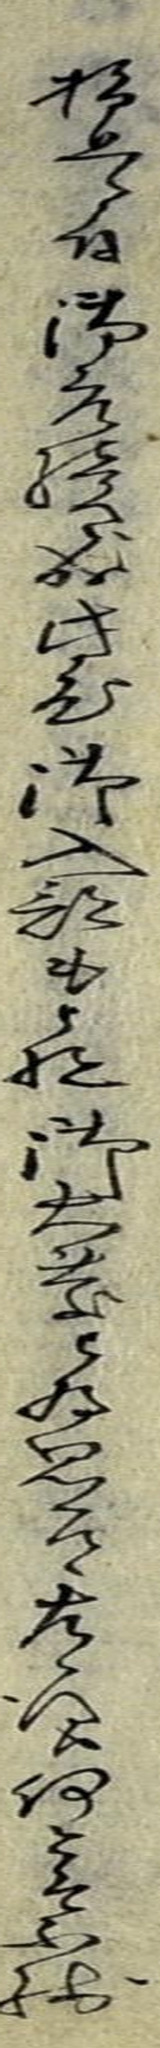指上候ニ付御取続被成此度御入部も被遊御大慶被為思召候左候得ハ何とそ不残
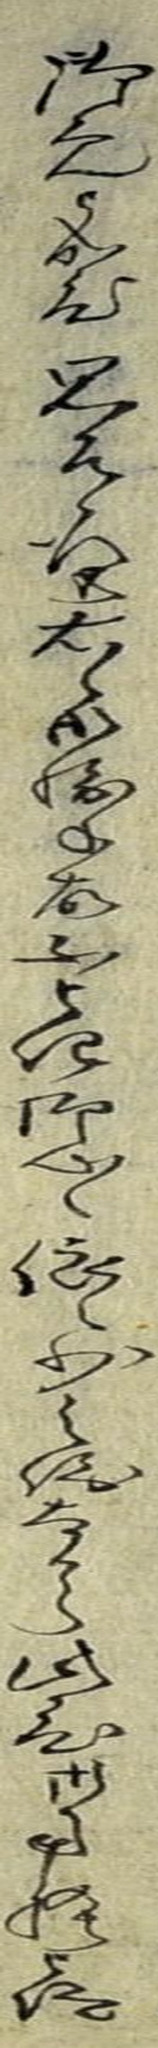御免被成度思召候得共右之御勝手故不被任御心候依之少之儀なから此度御用捨被仰
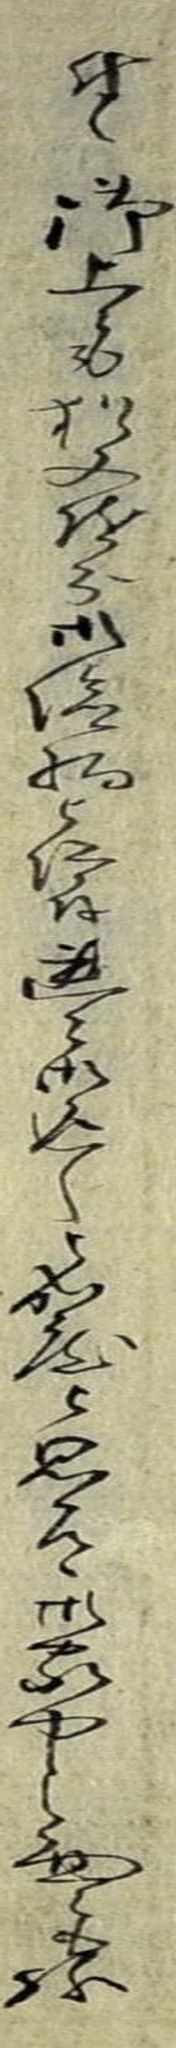付候御上ニも猶又随分御倹約被仰付連々御返し被成度被思召候御家中之面々も弥
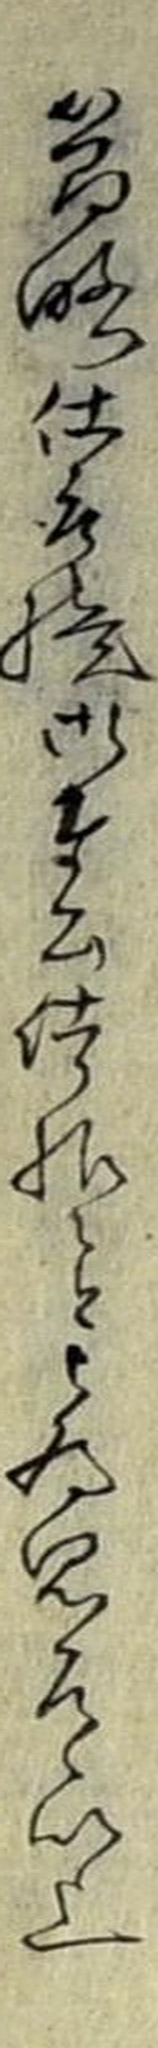簡略仕取続御奉公仕候様ニと被為思召候以上
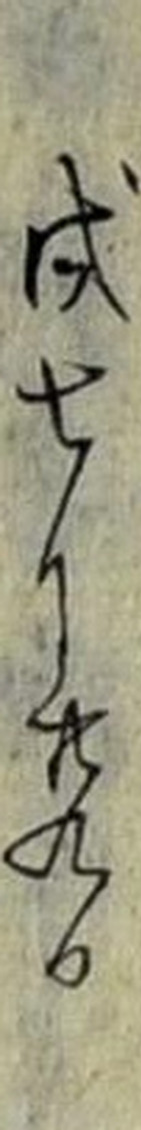戌七月廿九日
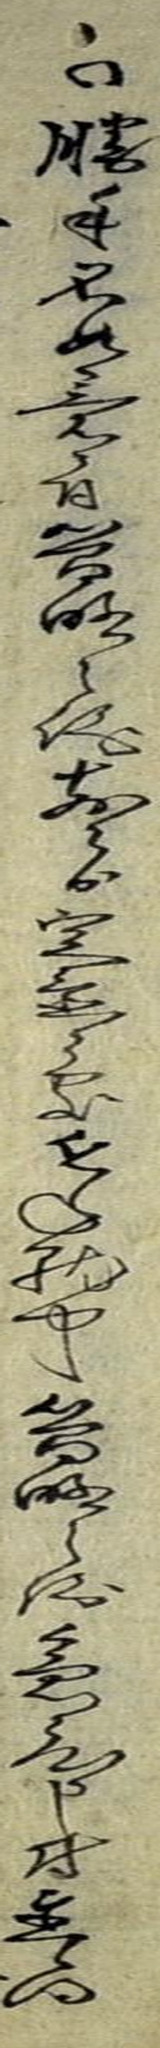〇勝手不如意ニ付簡略之儀前々ゟ定置候処近年就中簡略之儀急度申付置候得
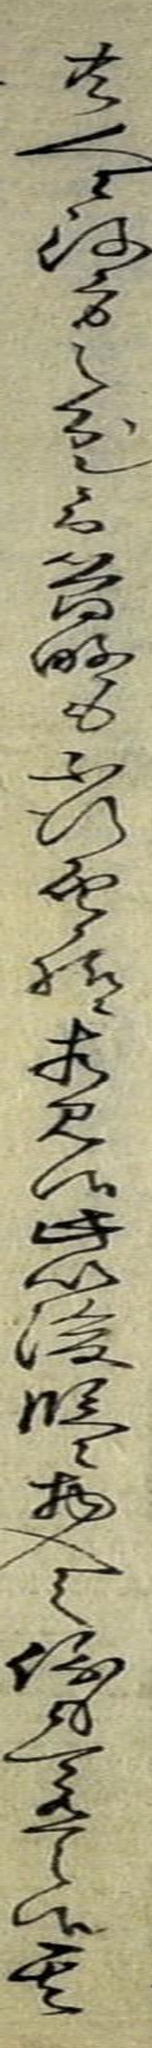共人々役方之分レニ而簡略も不行届候様ニ相見候此以後段々物入之儀も可有之候其
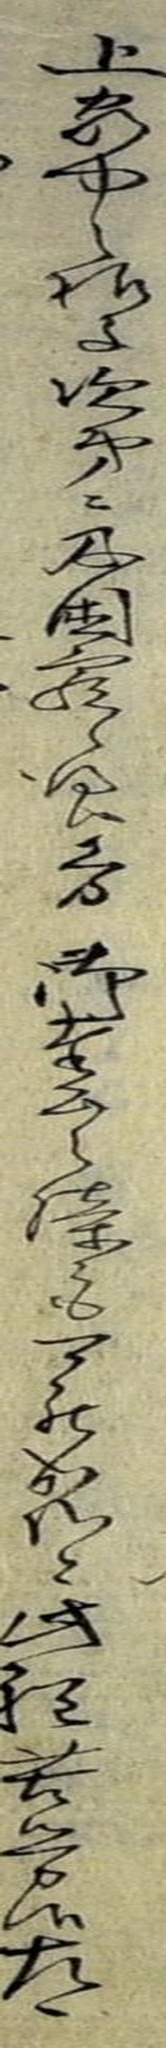上家中之様子次第ニ及困窮候得ハ旁御奉公之障ニも可罷成哉と此程苦労候左候
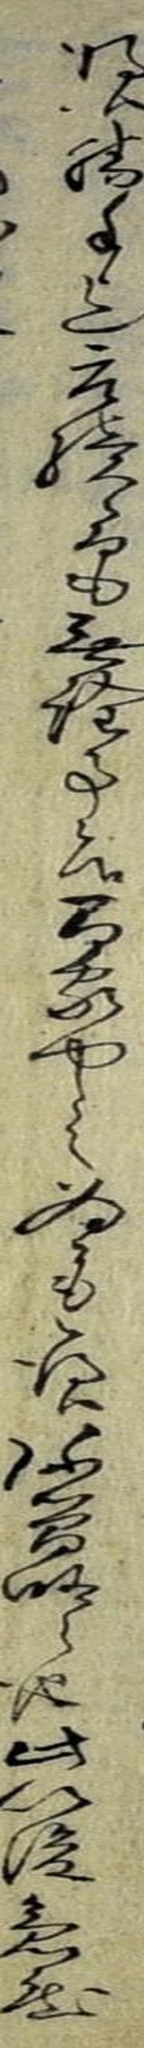得ハ勝手迄取続候而も無詮事ニ候間家中之為ニも候得ハ弥簡略之儀此以後急度
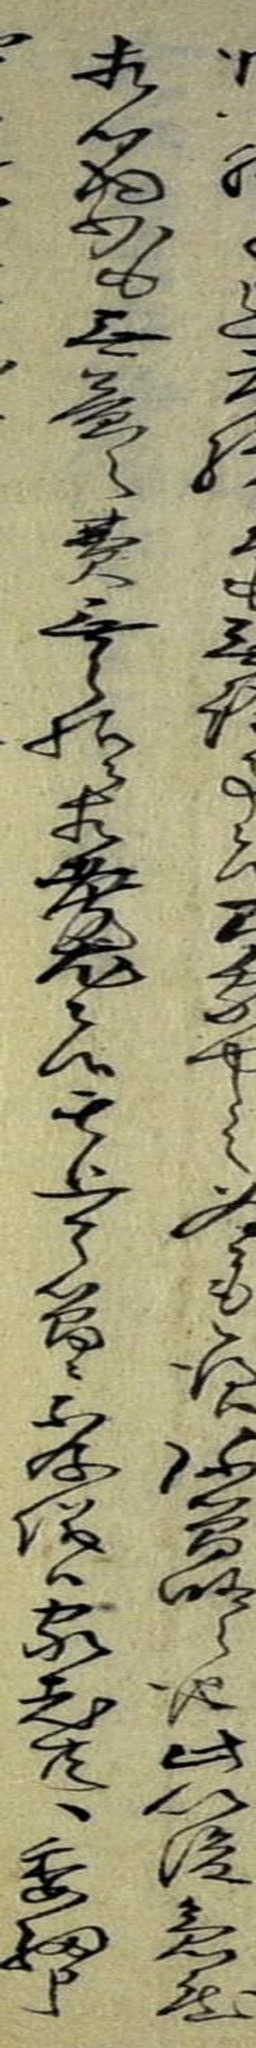相心得少も無益之費無之様ニ相考尤ニ候其上了簡ニ不及儀ハ家老共へ委細申
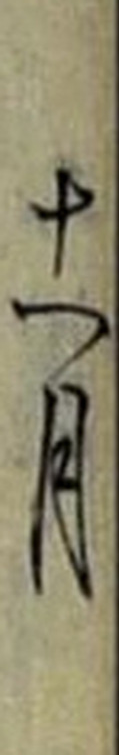十一月
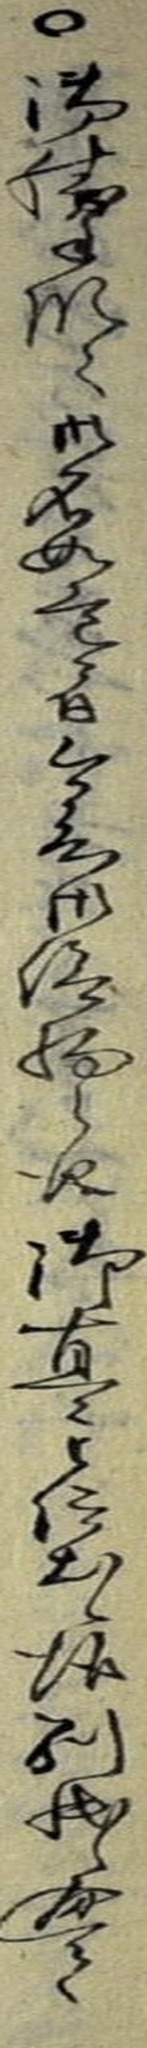〇御勝手段々御不如意ニ付今度御倹約之儀御直ニ被仰出候趣別紙之通ニ候
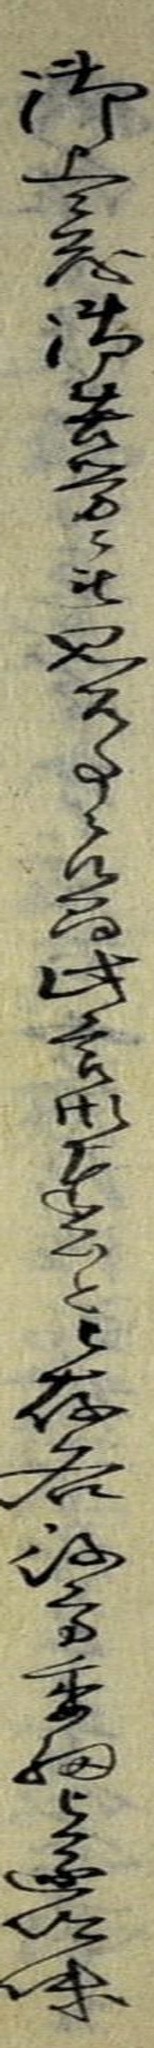御上ニ茂御苦労ニ被思召事ニ候間此節御奉公と被存各役方委細被遂吟味
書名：命令之部 一
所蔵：福井県文書館 Fukui Prefectural Archives
